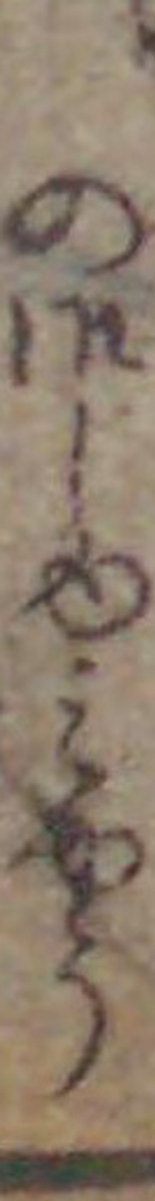の御しゆみやう
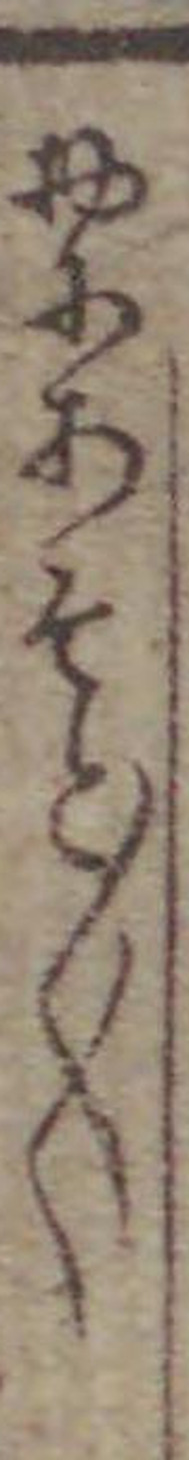おにあそと〳〵〳〵
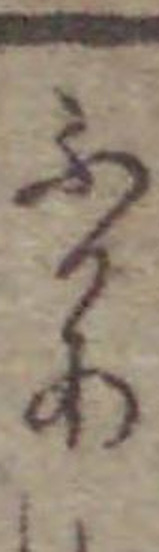ふかあ
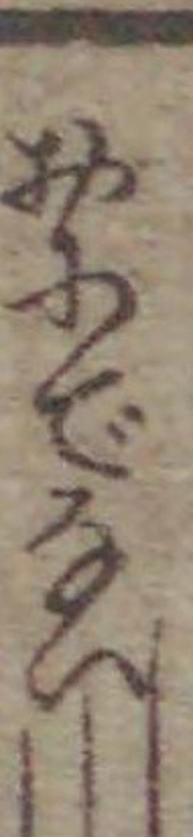おにでない

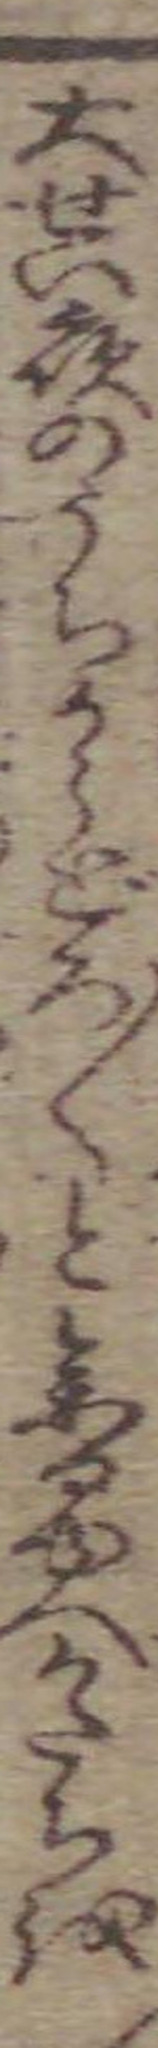大せい夜のうちからどろ〳〵と参るゆへかたちを
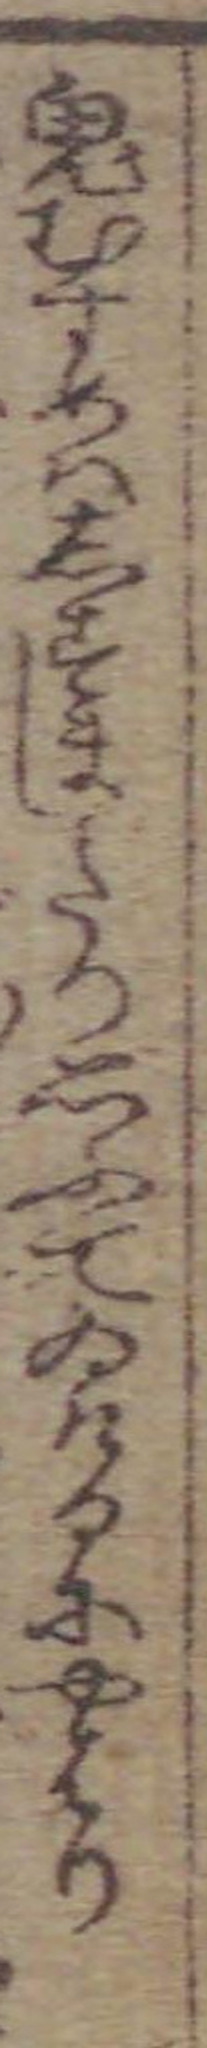鬼むすめはしすましたり思ふてゐけるにやはり
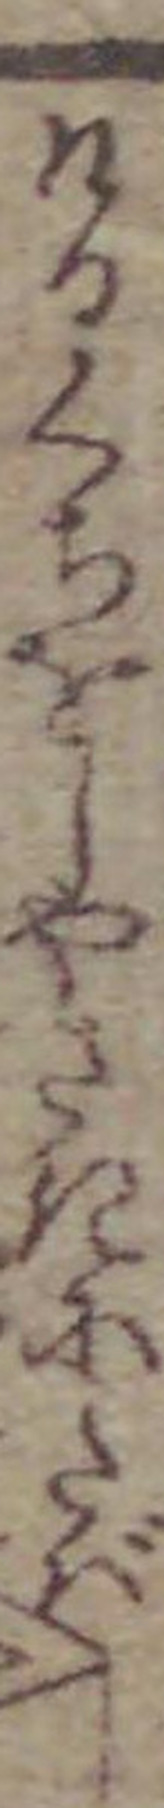けるくちをしやさきにたば
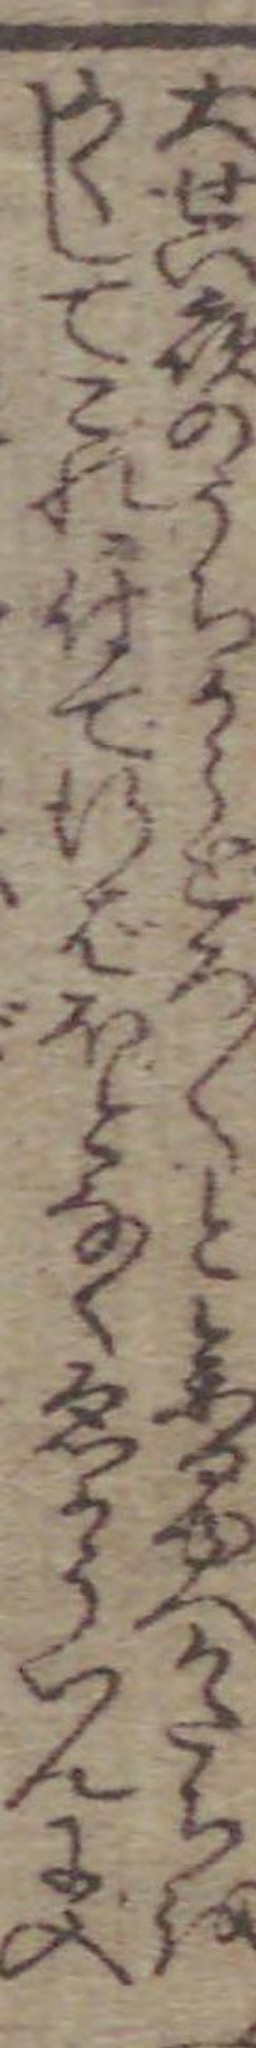かくしてこれに付て行ばほとなくゑかういんに入
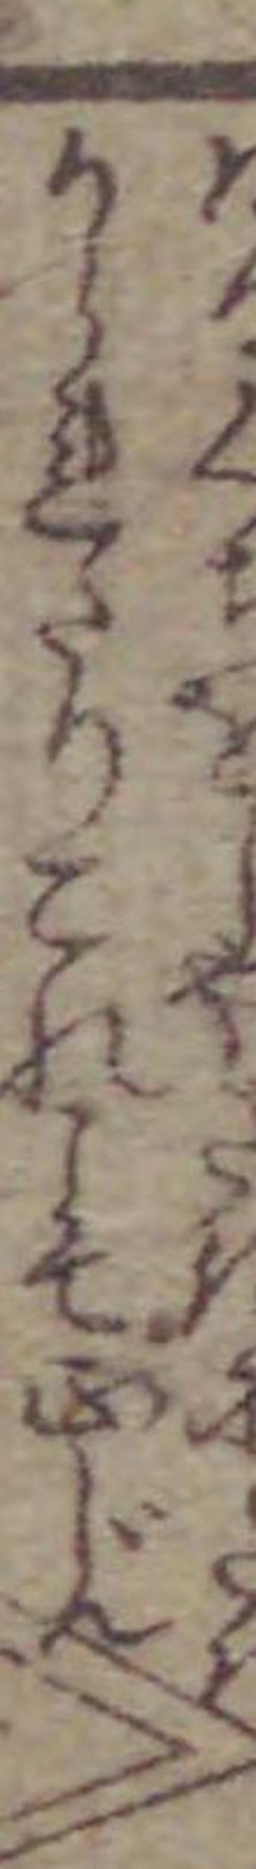かられたりこれこそ正じん
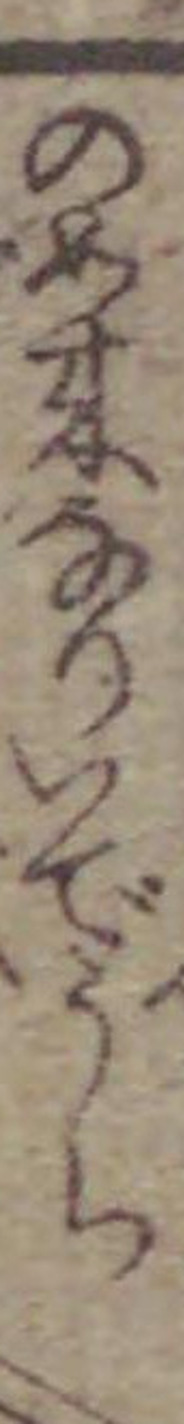の如来なりいでうち
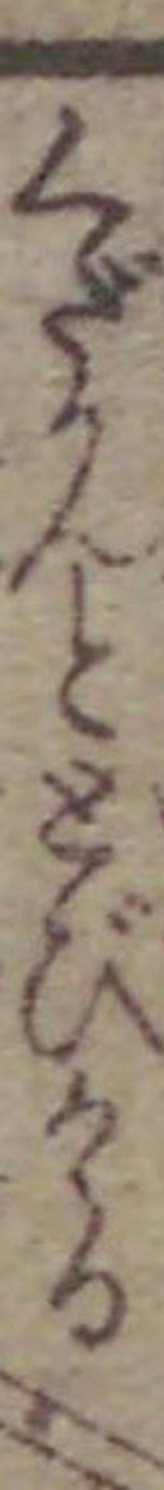くだかんととびかゝる
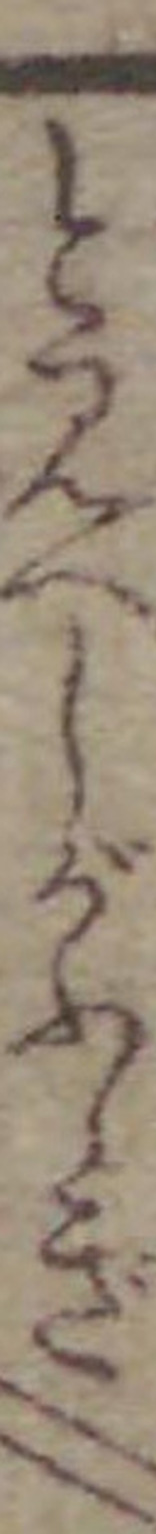と見へしがふしぎ
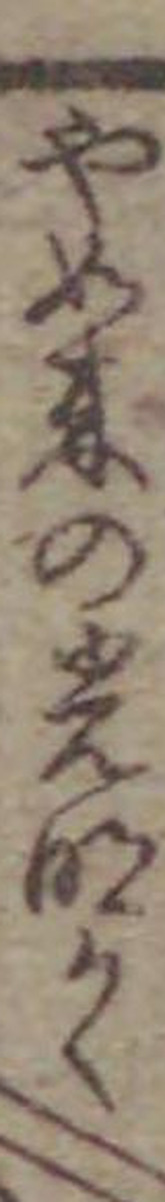や如来の光明かく
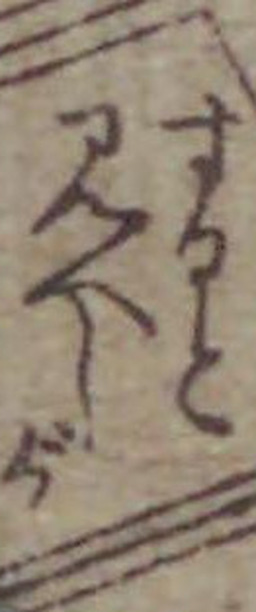見へしが
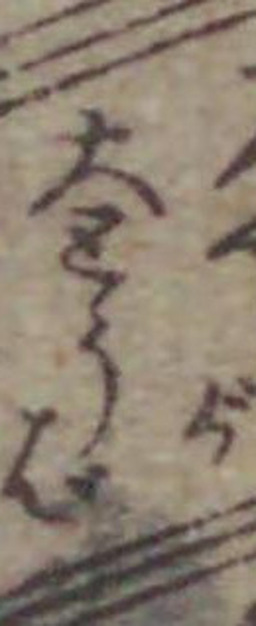大とうば
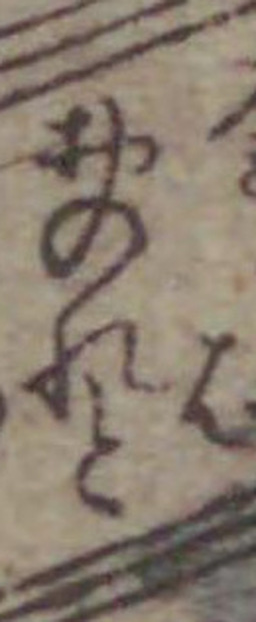おのれと
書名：鬼の趣向草 2巻
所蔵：国立国会図書館 National Diet Library, JAPAN
